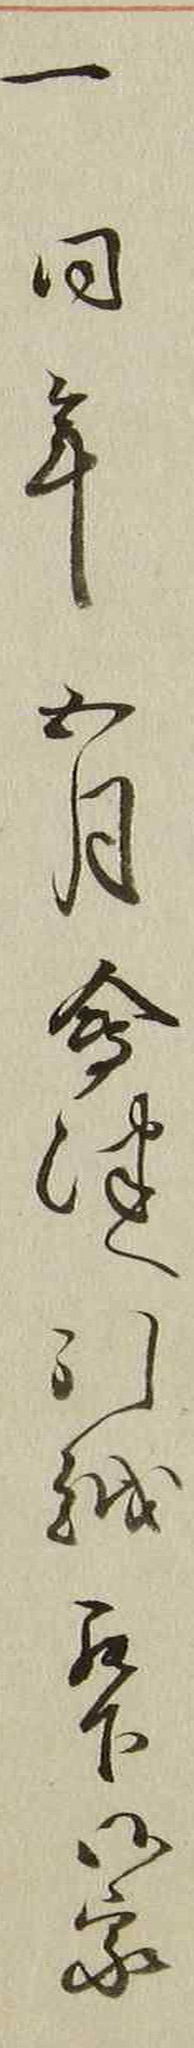一同年五月会津へ引越し罷り下り御家
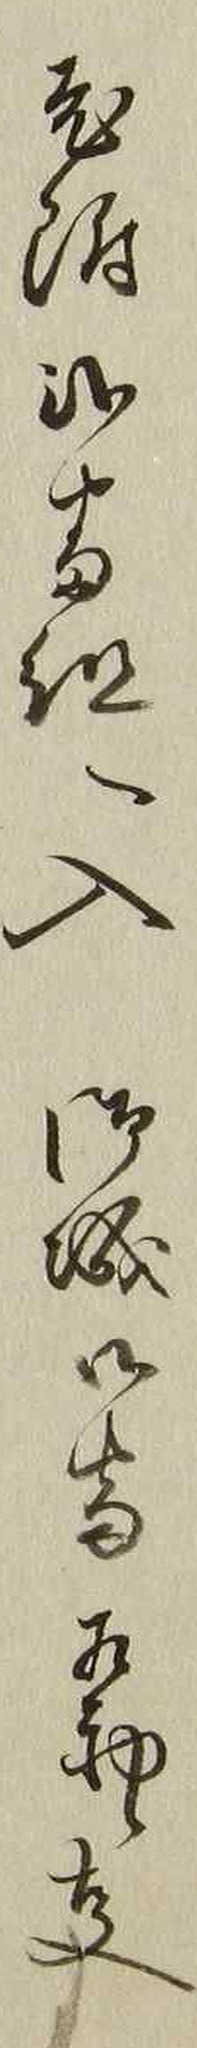老附き弐番組へ入御城御番相勤め候事
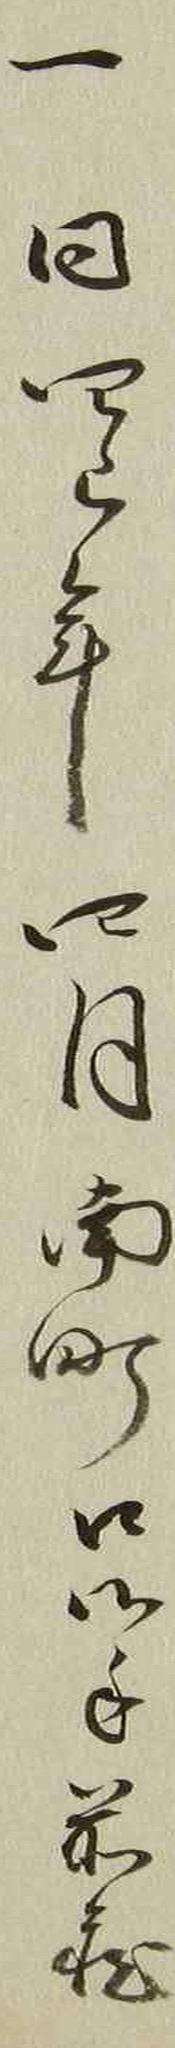一同四巳年四月南町口御手前蔵
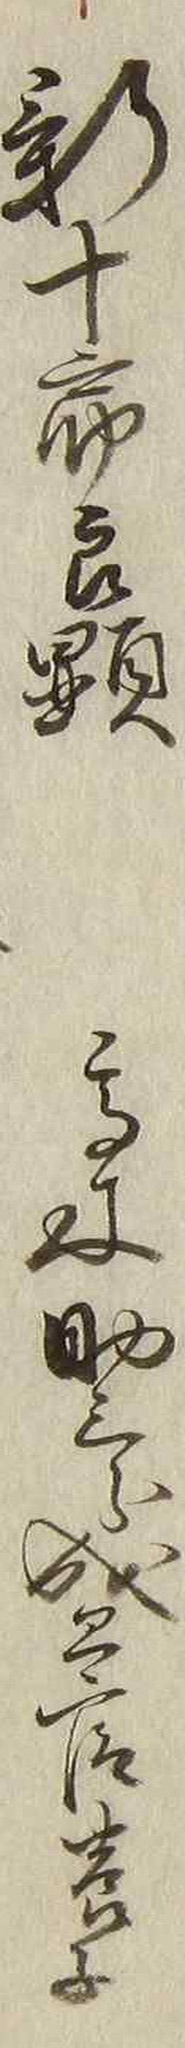新十郎良顕高木助三郎盛庵養子
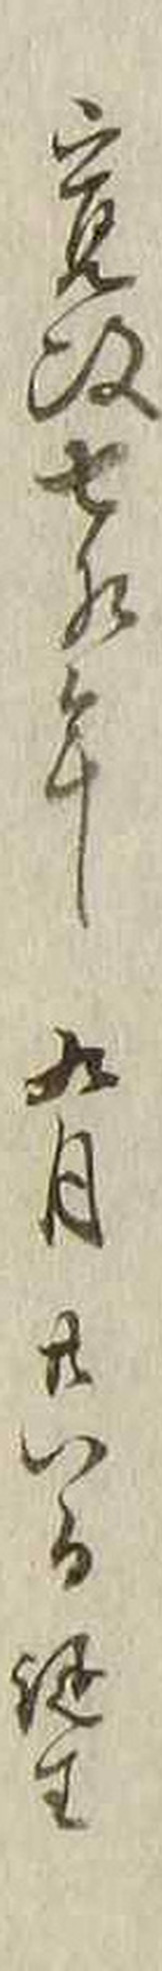寛政七卯年九月廿八日誕生
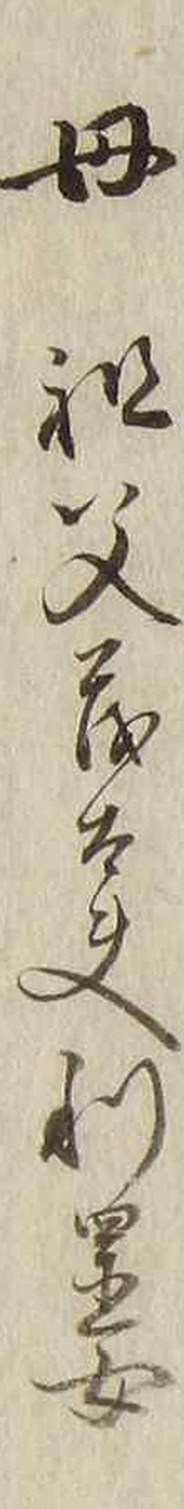母祖父茂大夫利置女

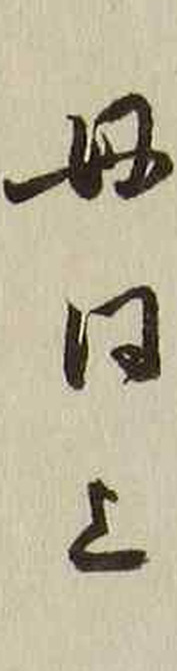母同上
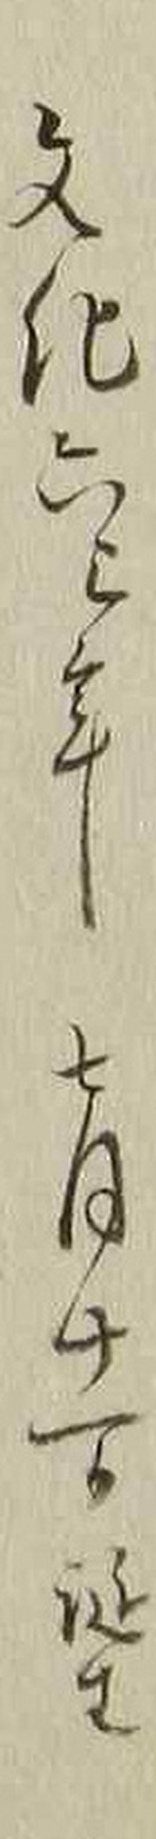女文化六巳年七月十一日誕生
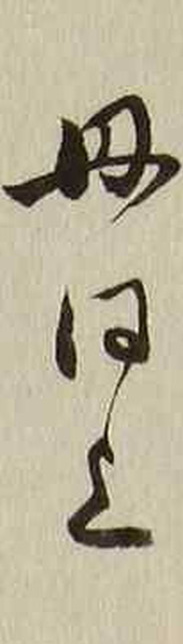母同上
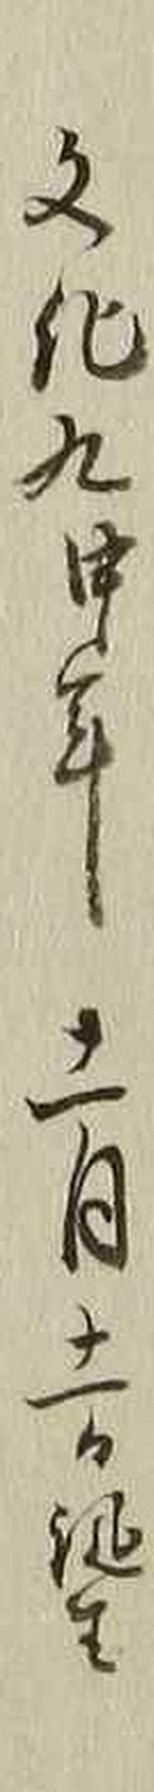女文化九申年十一月十一日誕生
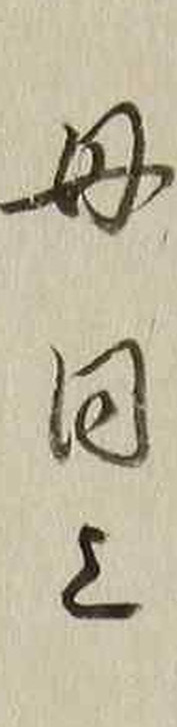母同上
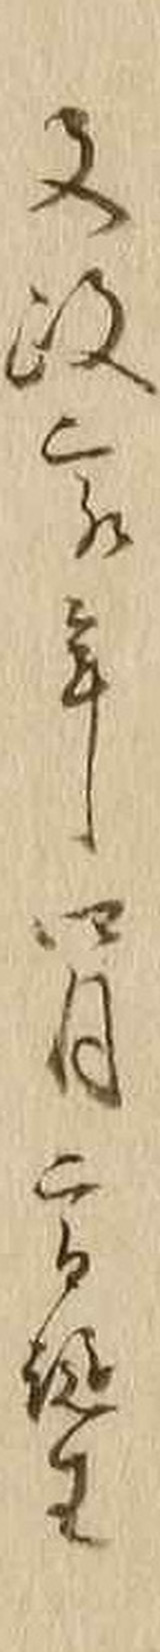女文政二卯年四月二日誕生
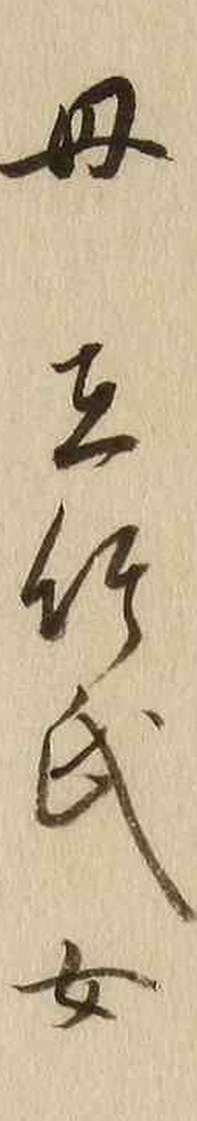母在竹氏女
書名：諸士系譜　巻之20　い之部20
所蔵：会津若松市立会津図書館
